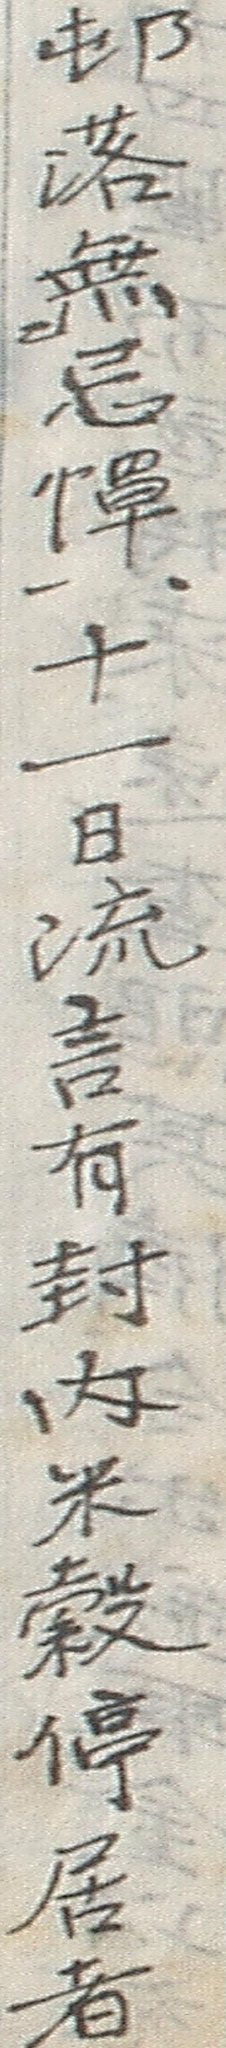邨落無忌憚、十一日流言有封内米穀停居者

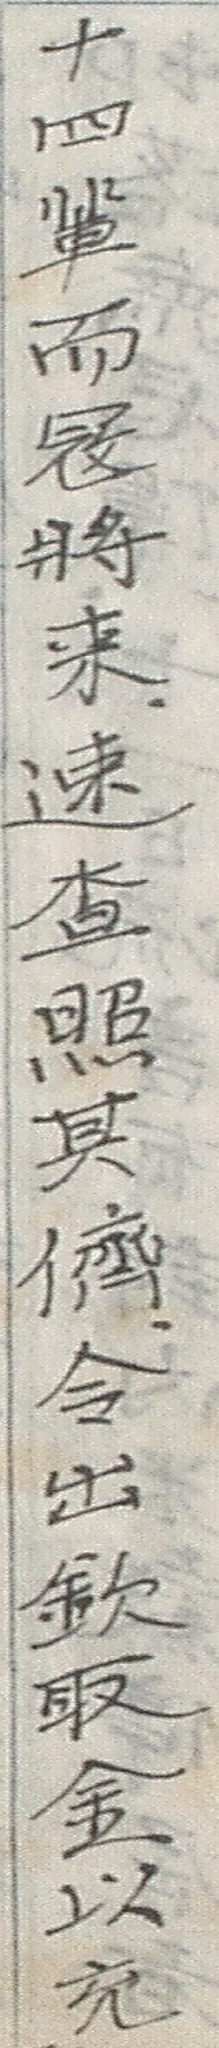十四輩而寇将来、速査照其儕、令出欽取金以充
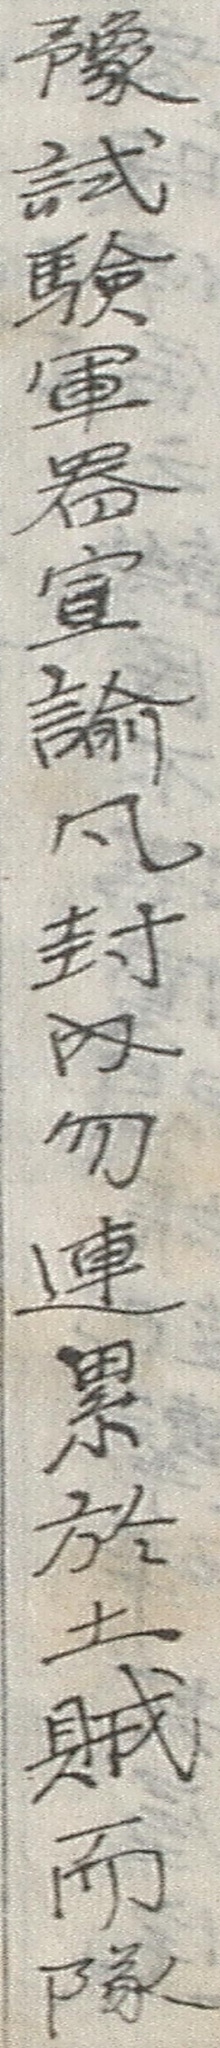豫試験軍器宜諭凡封内勿連累於土賊而隊
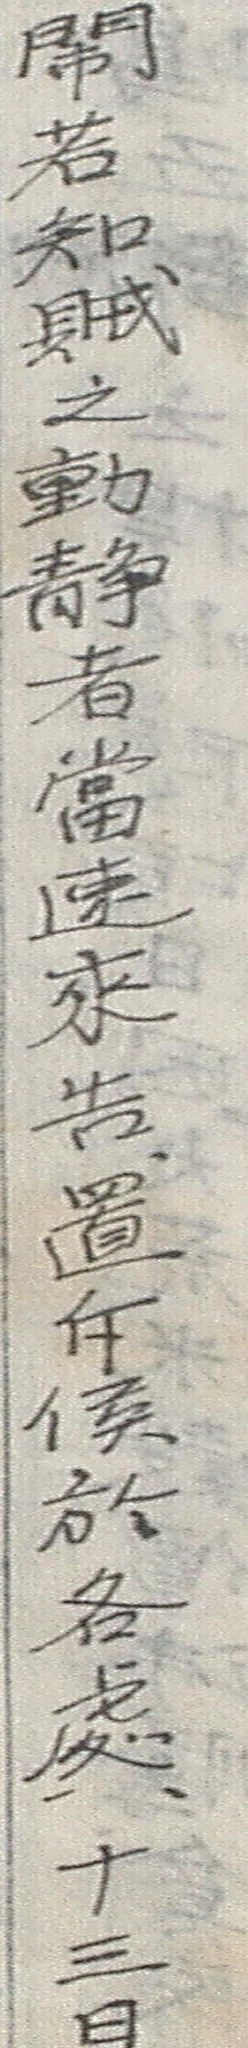鬧若知賊之動静者当速来告、置斥候於各処、十三日
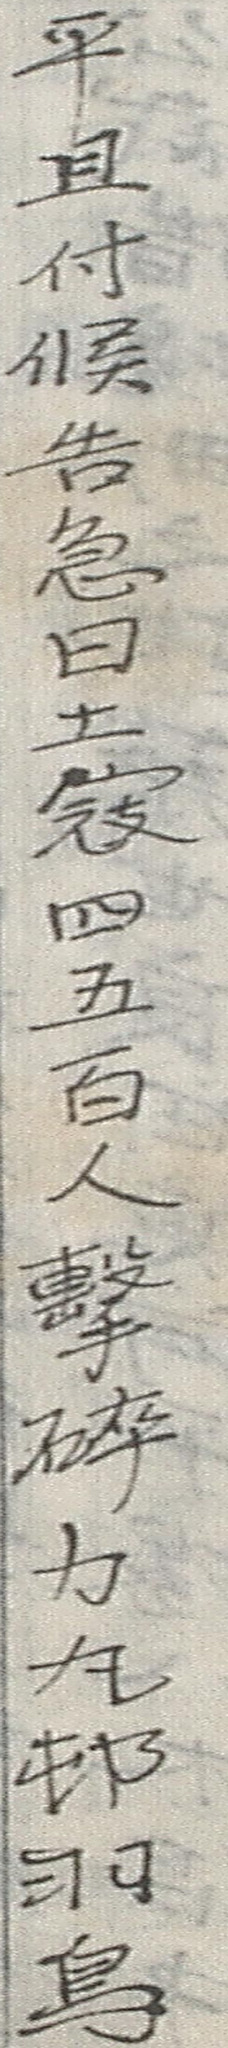平且付候告急日土寇四五百人撃砕力丸邨羽鳥
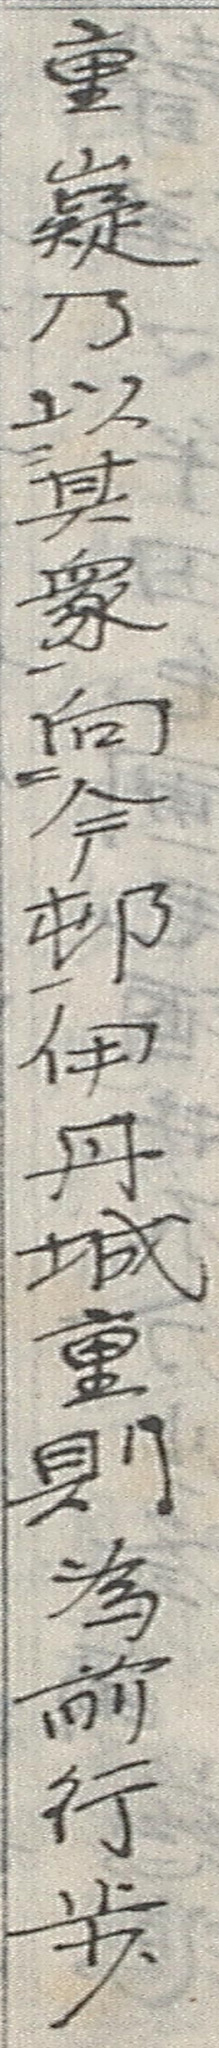重嶷乃以其衆向今邨伊丹城重則為前行歩
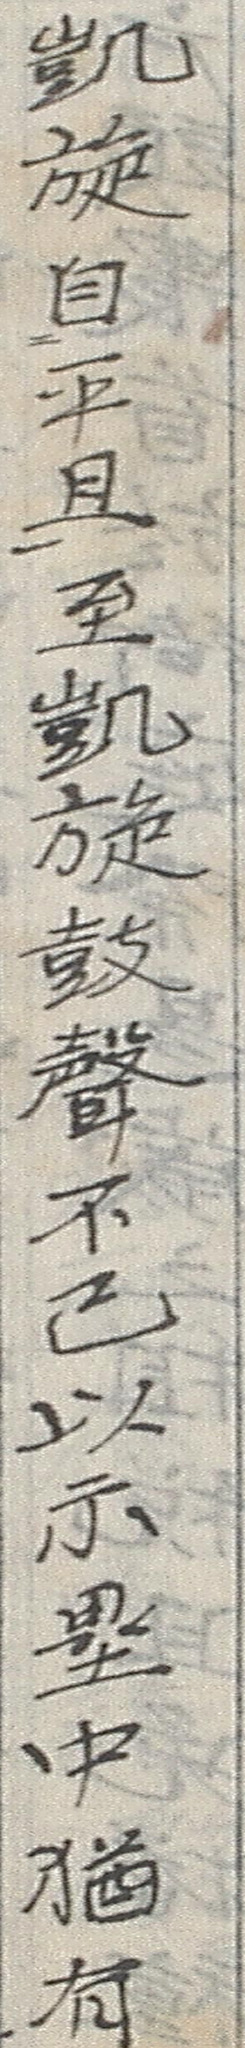凱旋自平且至凱鼓声不止以示野中猶有
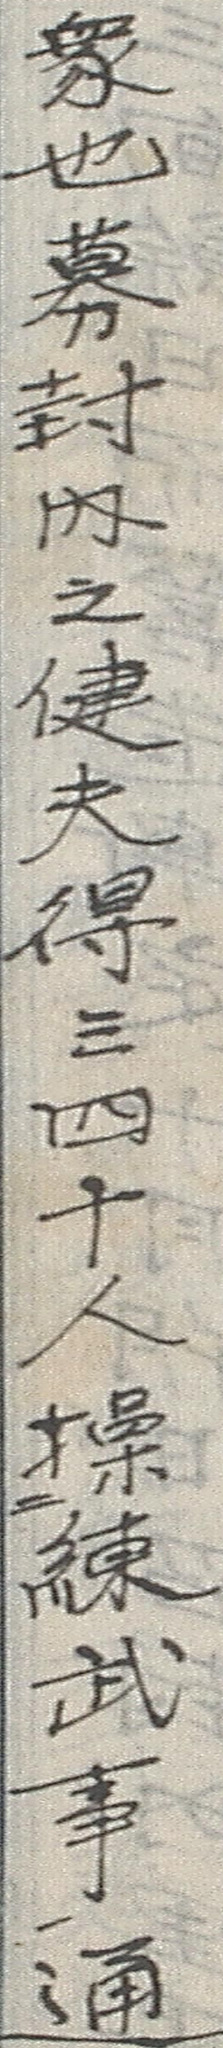衆也募封内之健夫得三四十人操練武殊通
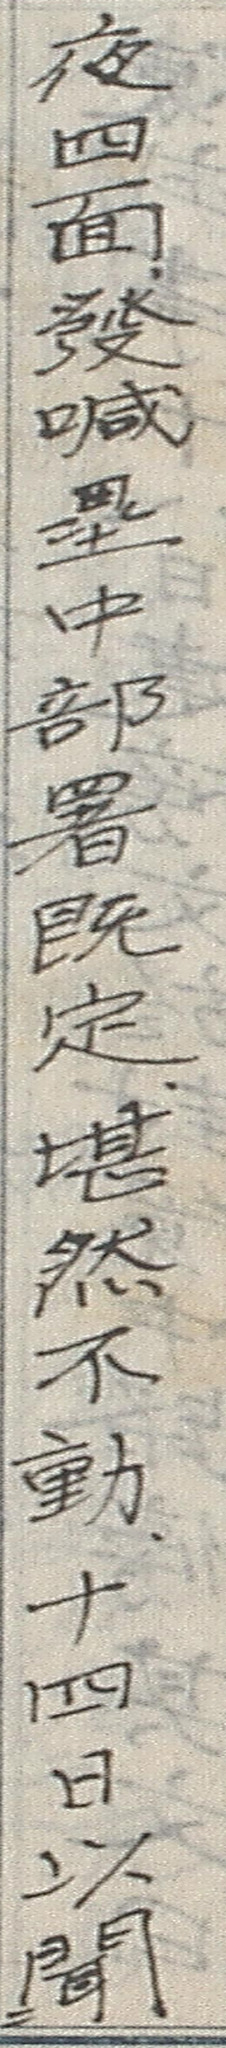夜四面発喊塁中部署既定、堪然不動、十四日以聞
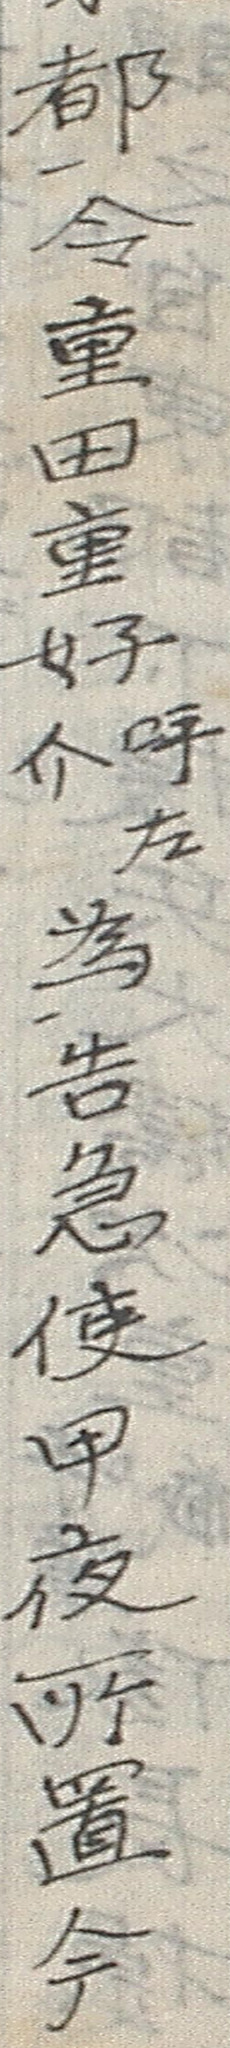東部令重田重好呼左介為告急使甲夜所置今
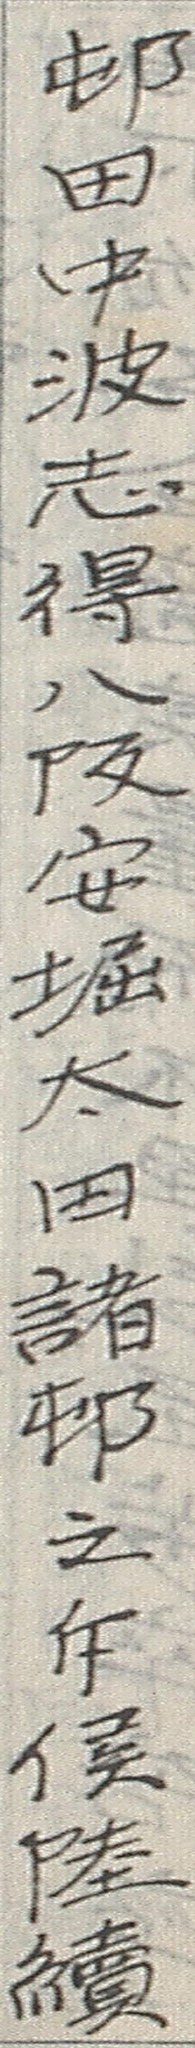邨田中波志得八阪安堀太田諸邨之斤侯陸続
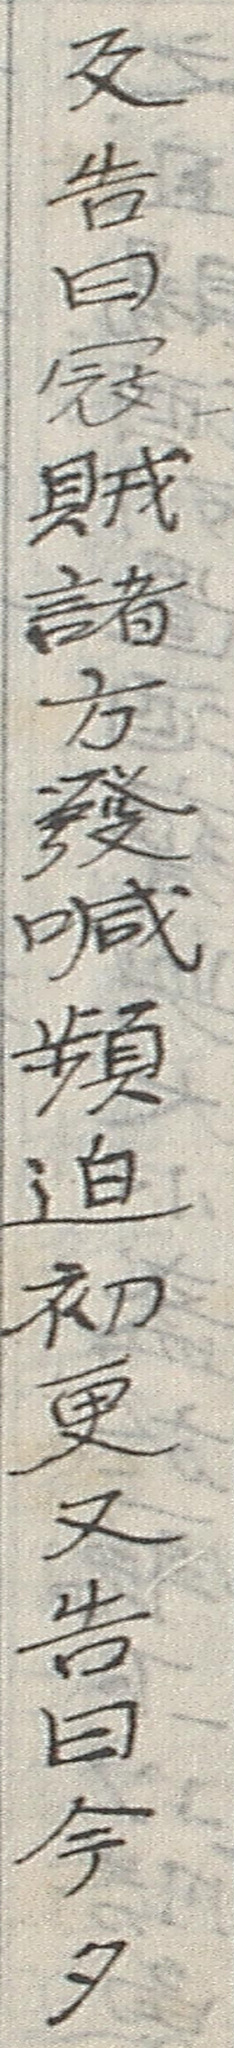反告曰冦賊諸方発喊頻迫初更又告曰今夕
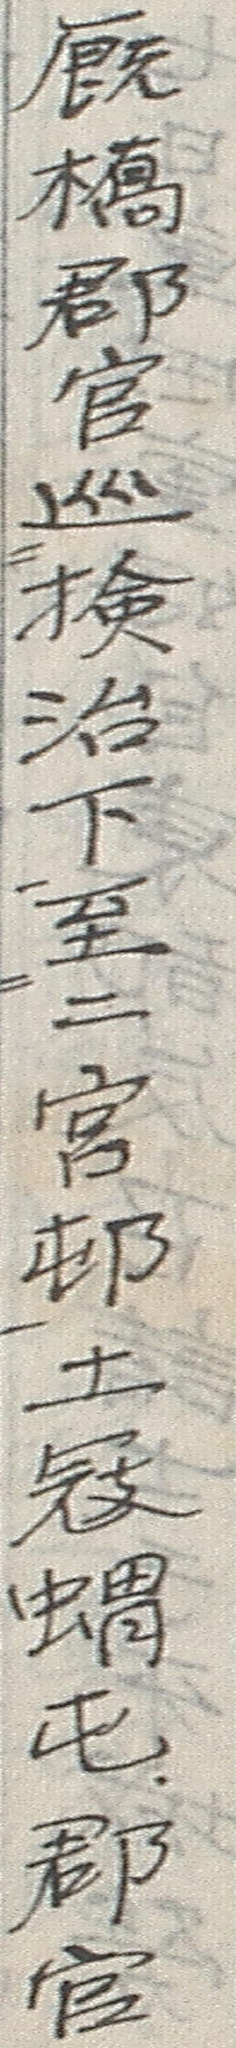厩橋郡官巡検治下至二宮邨土冦蝟屯、郡官
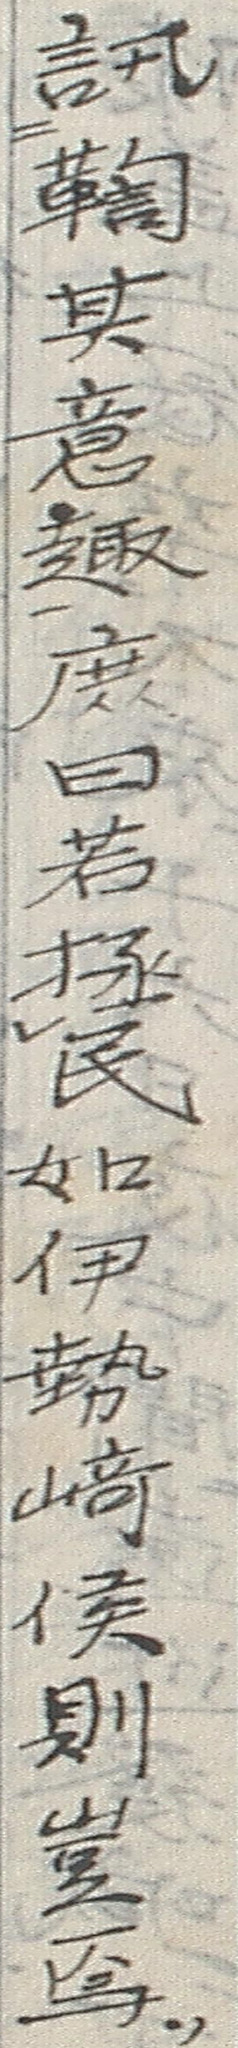訊鞫其意趣庶曰若拯ㇾ民如伊勢崎侯則豈鳥、
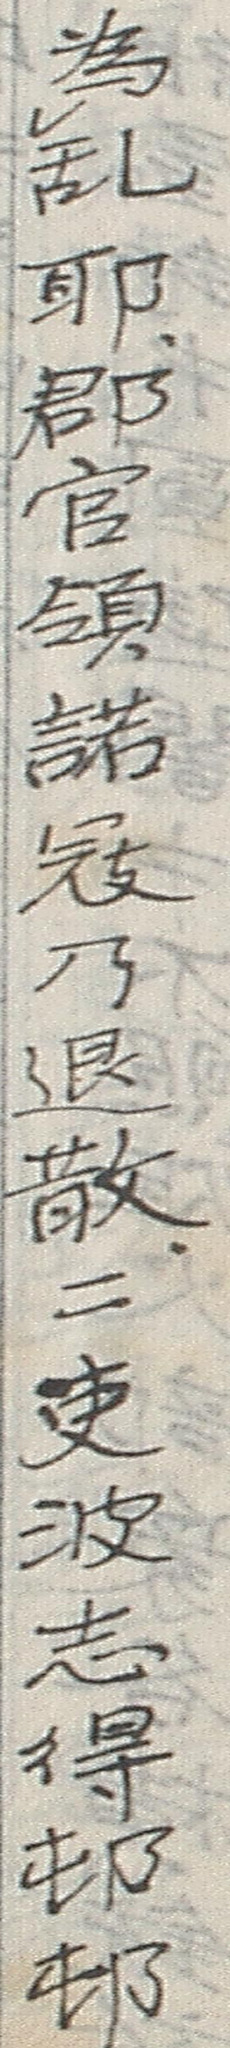為ㇾ乱耶、郡官領諾冦乃退散、二吏波志得邨邨
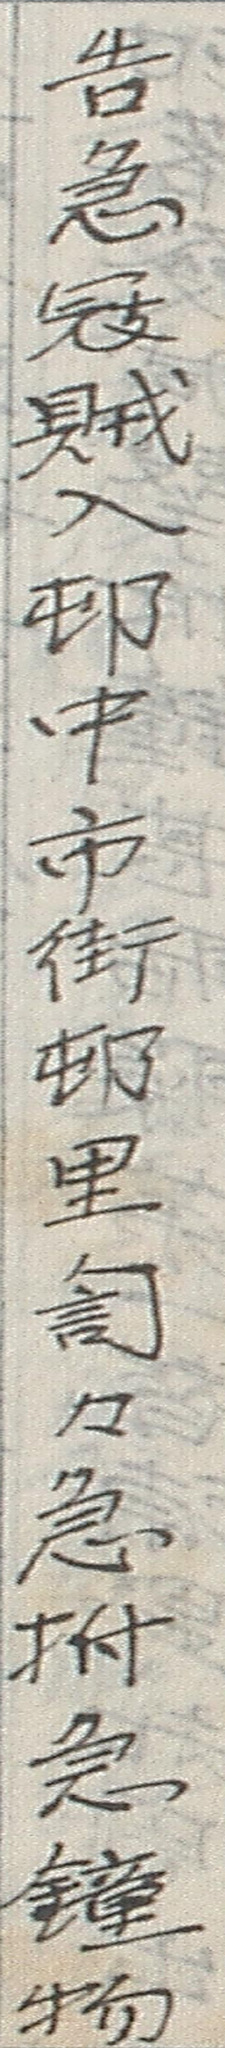告急冦賊入り邨中市街邨里訇々急拊急鐘物
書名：天明三年癸卯六月　沙降記　［蕗原拾続巻之五十二］
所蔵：東京大学地震研究所図書室 Earthquake Research Institute Library, The University of Tokyo, JAPAN
